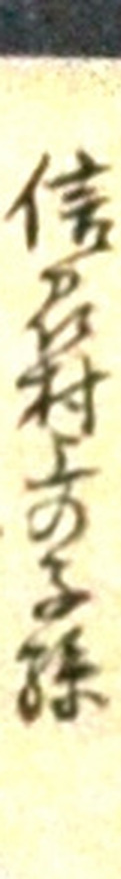信州村上の子孫
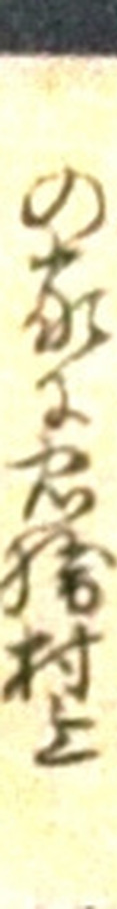の家に忠勝村上
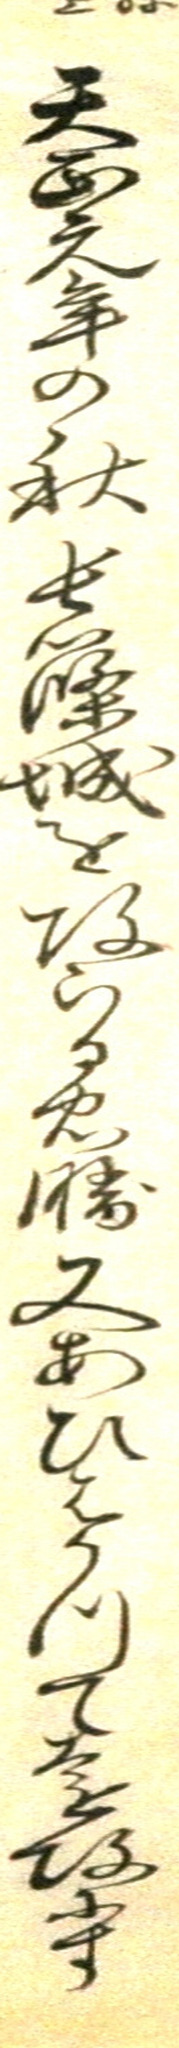天正元年の秋長篠城を攻らる忠勝又あひはかつて遠攻にす
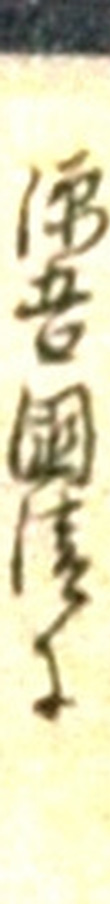源吾国清に
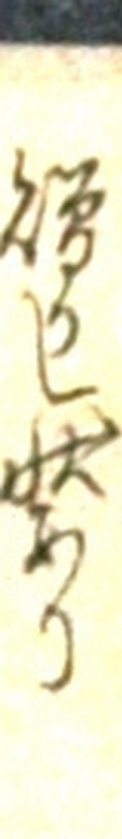贈りし状あり
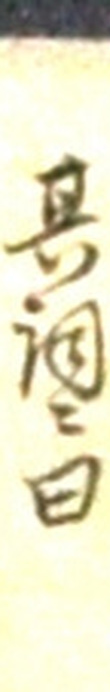其詞に曰
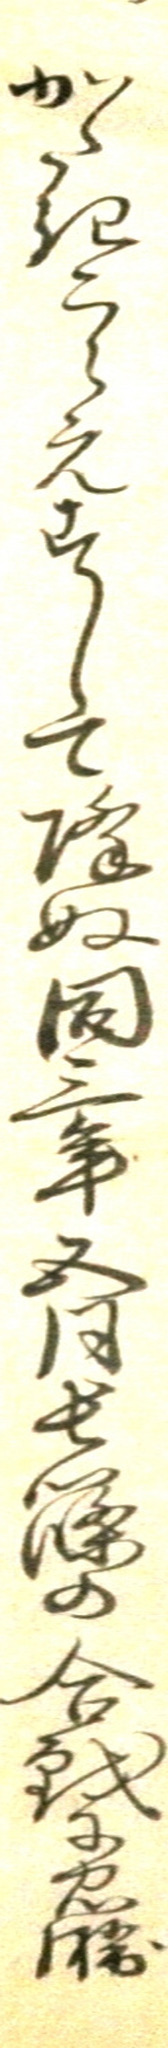かたきこらえすして降ぬ同三年五月長篠の合戦に忠勝
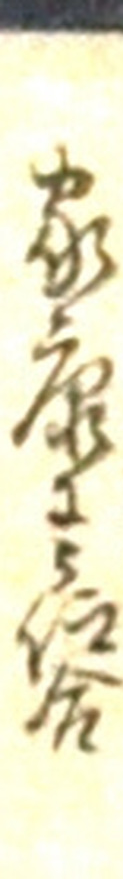家康に被仰合
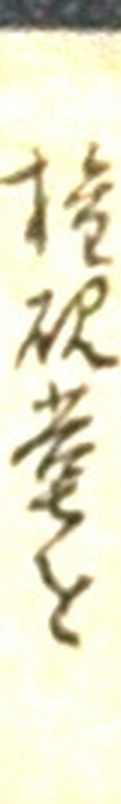権現堂を
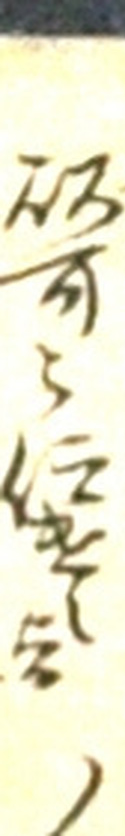以可と仰遣之旨
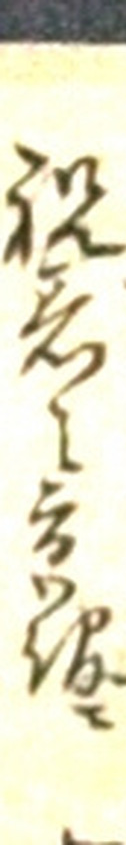祝着之旨は報に
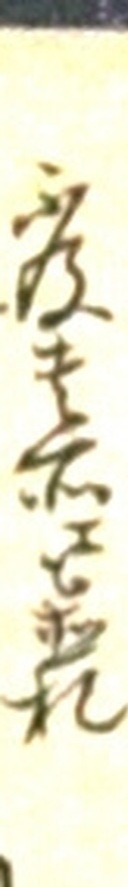不及其所えも直札
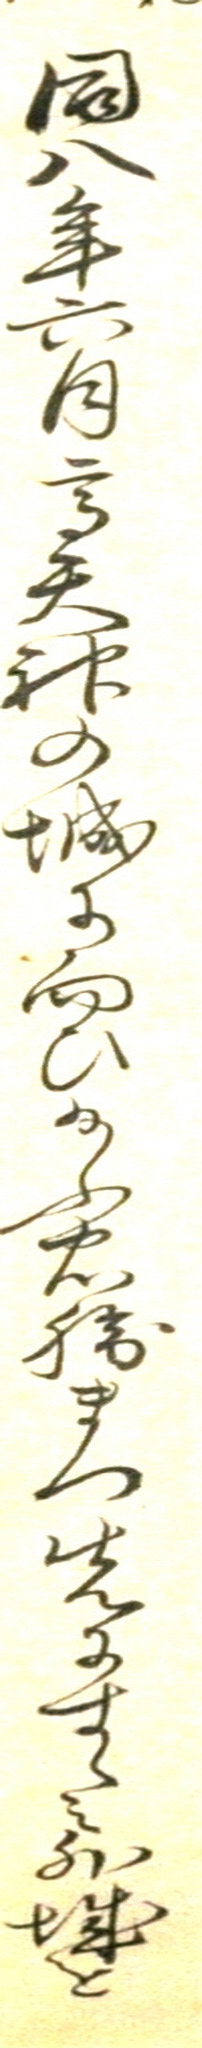同八年六月高天神の城に向ひ給ふ忠勝まつ先にすゝみ外城を
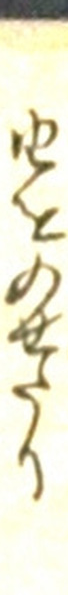由をのせたり
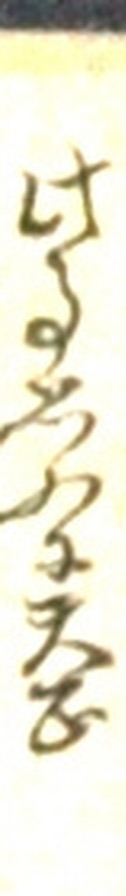此事思ふに天正
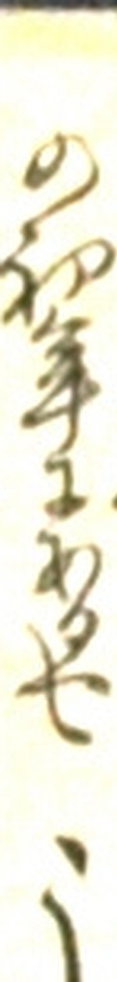の初年にあるへし
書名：藩翰譜（四・上）
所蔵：伊那市立高遠町図書館・合同会社AMANE
